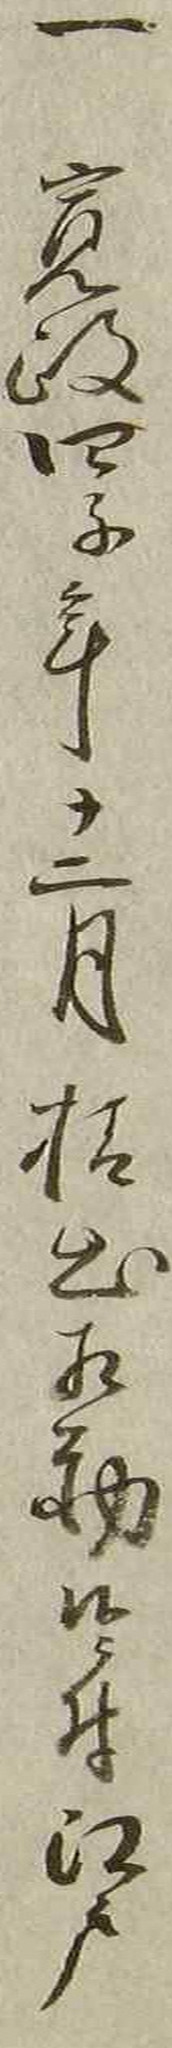一寛政四子年十二月精出相勤候ニ付江戸
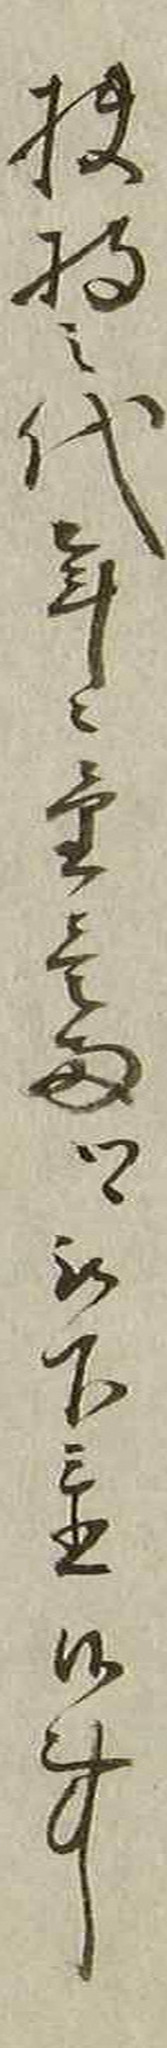扶持之代年々金壱両ツヽ被下置候事
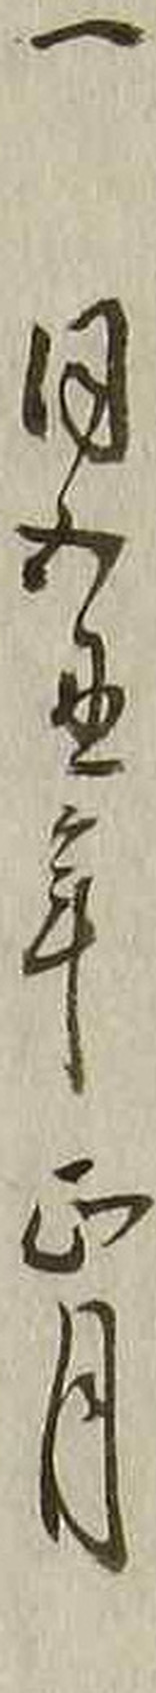一同五丑年正月
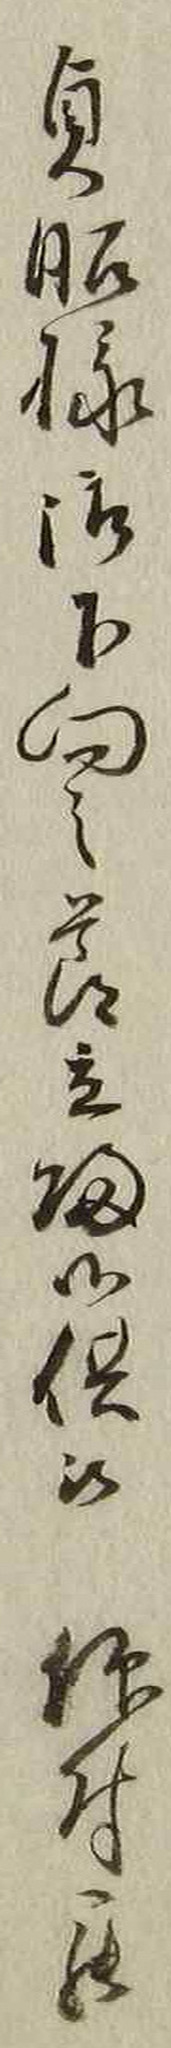貞昭様御下向之節立帰御供被仰付罷
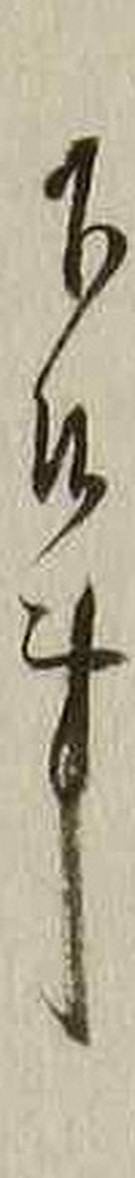下候事
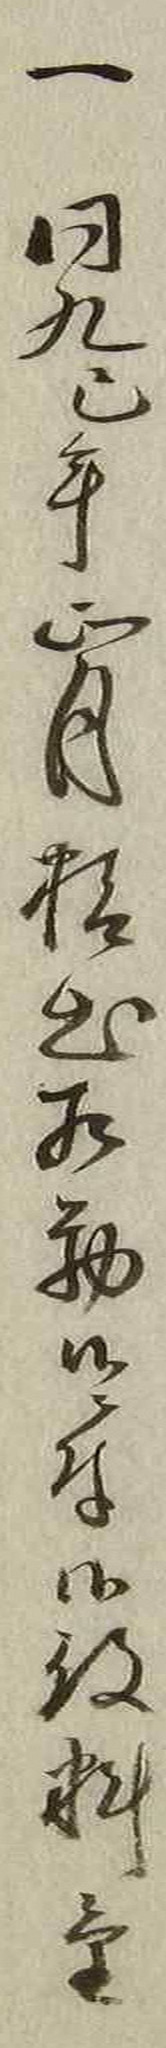一同九巳年正月精出相勤候ニ付御役料金
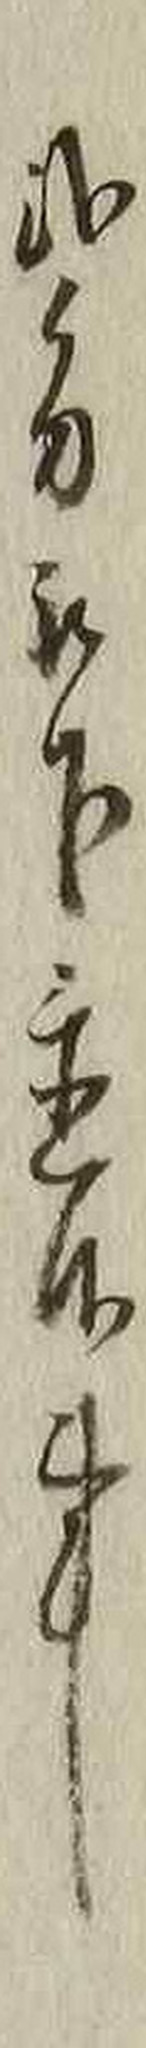弐分被下置候事
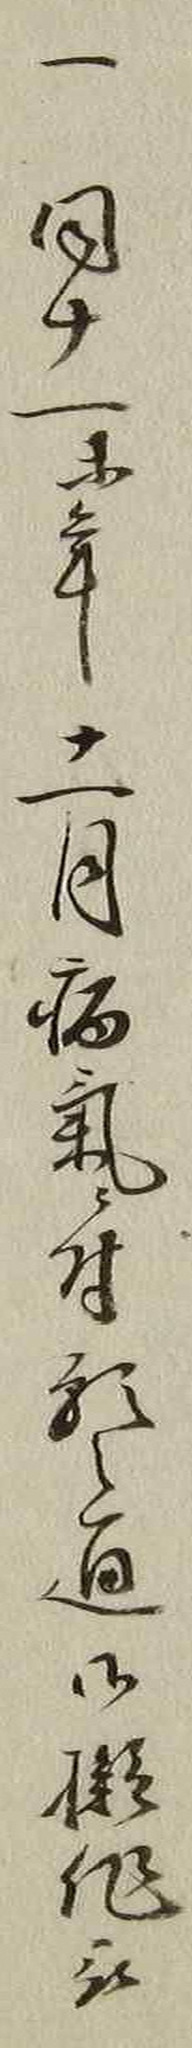一同十一未年十一月病気ニ付願之通御擬作被
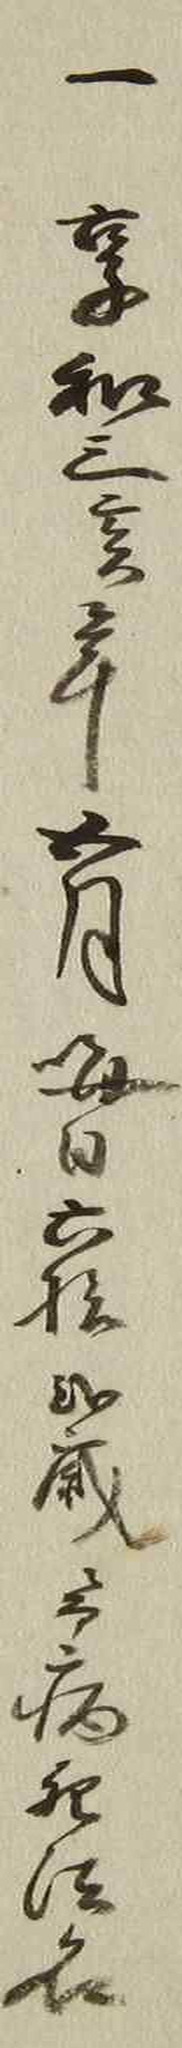一享和三亥年五月晦日六拾弐歳ニ而病死法名
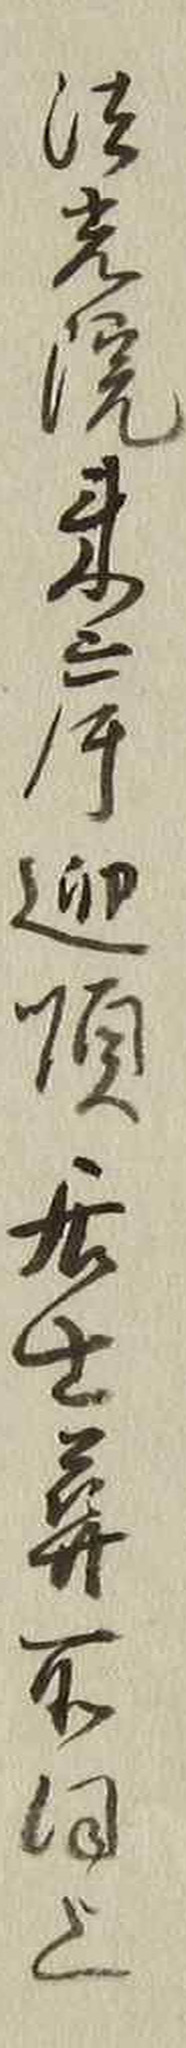法光院来岸迎順居士葬所同上
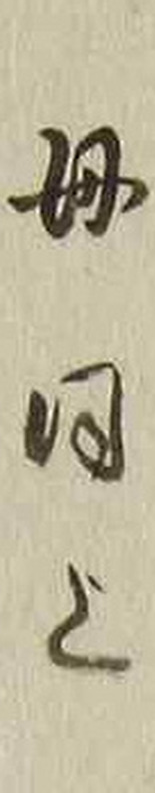母同上
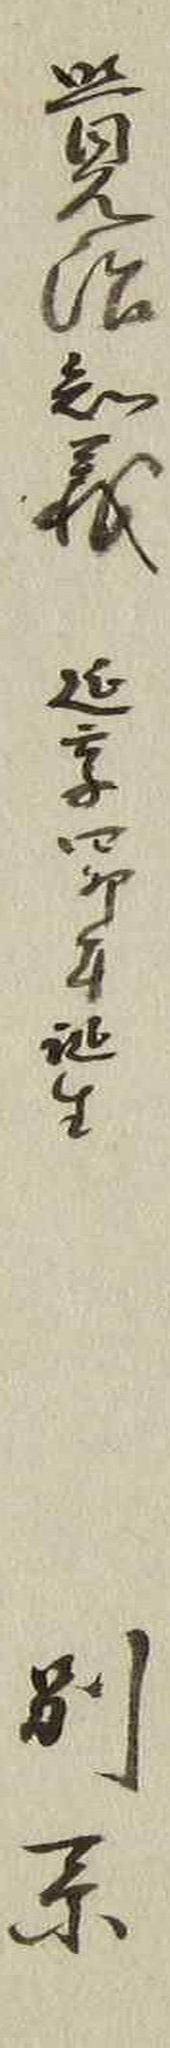覚治知義延享四卯年誕生別系
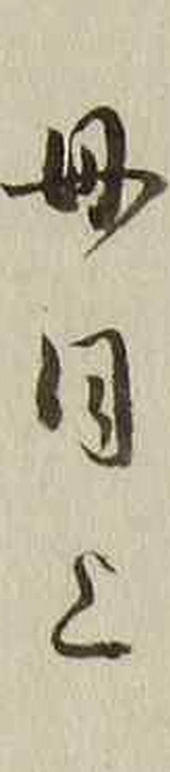母同上
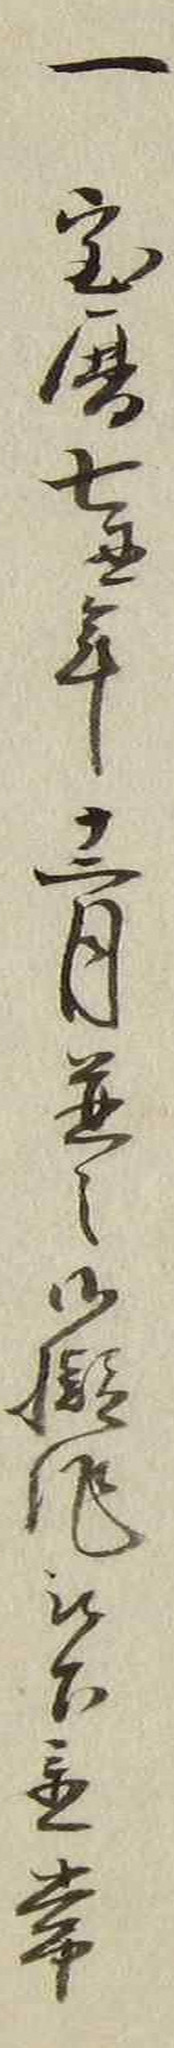一宝暦七丑年十二月並之御擬作被下置常
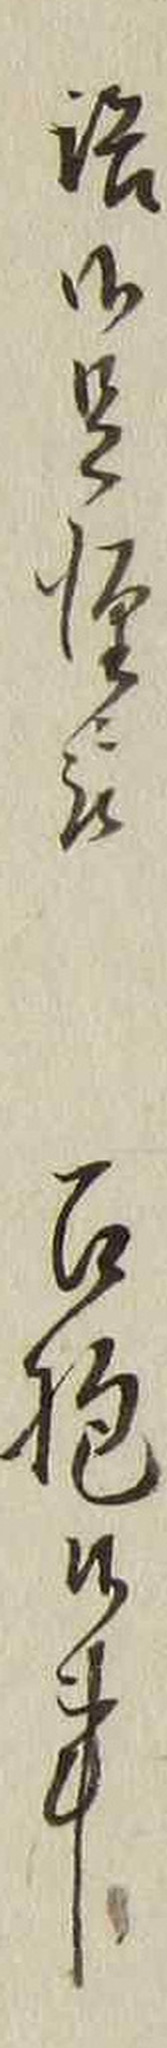詰足軽ニ被召抱候事
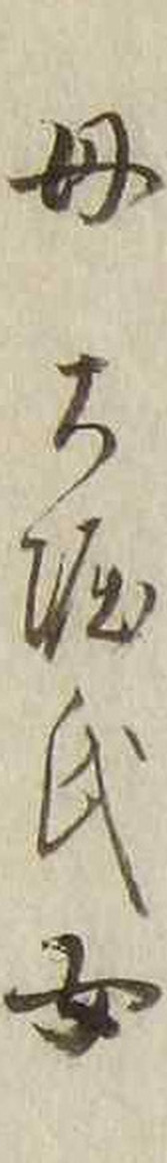母大堀氏女
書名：諸士系譜　巻之132　た之部8
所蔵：会津若松市立会津図書館
